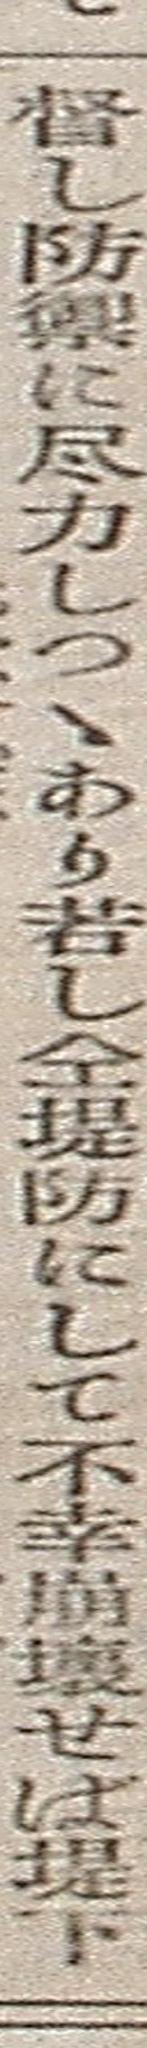督し防禦に尽力しつゝあり若し同堤防にして不幸崩壊せば堤下
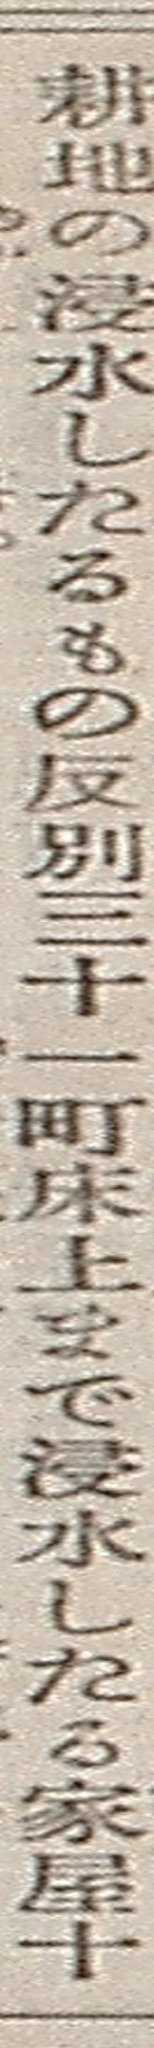耕地の浸水したるもの反別三十一町床上まで浸水したる家屋十
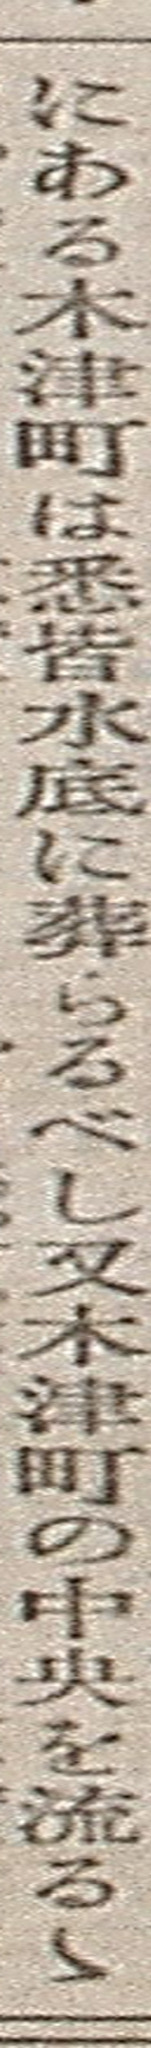にある木津町は悉皆水低に葬らるべし又木津町の中央を流るゝ
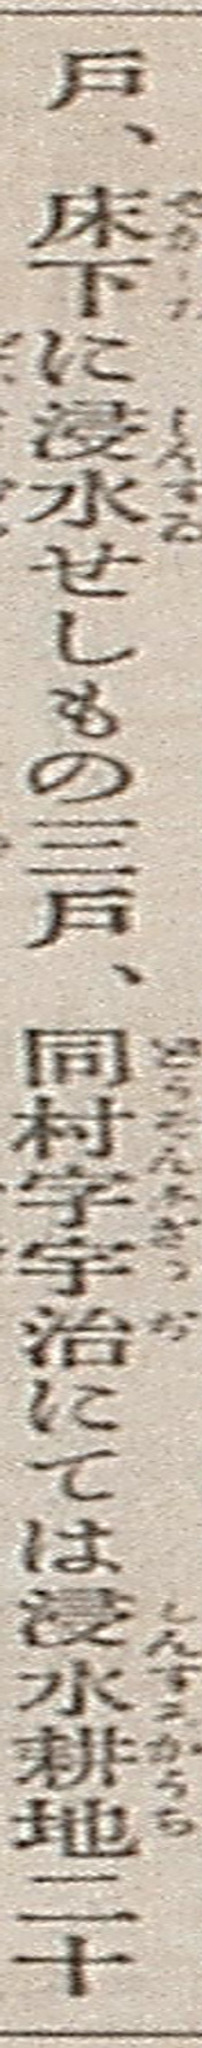戸、床下に浸水せしもの三戸、同村字宇治にては浸水耕地二十
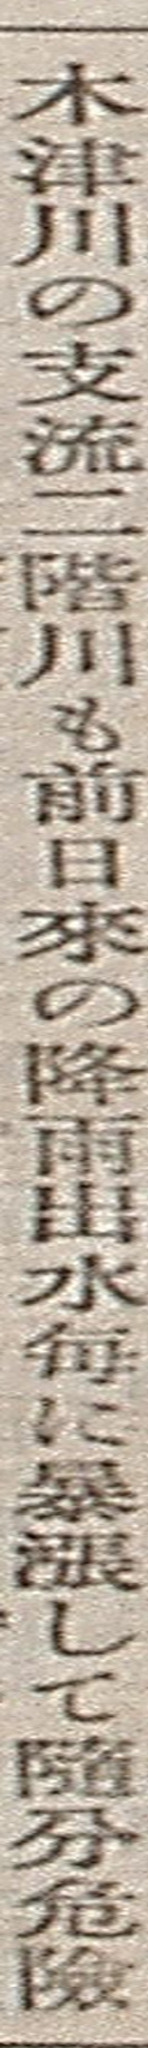木津川の支流二階川も前日來の降雨出水毎に暴漲して随分危険
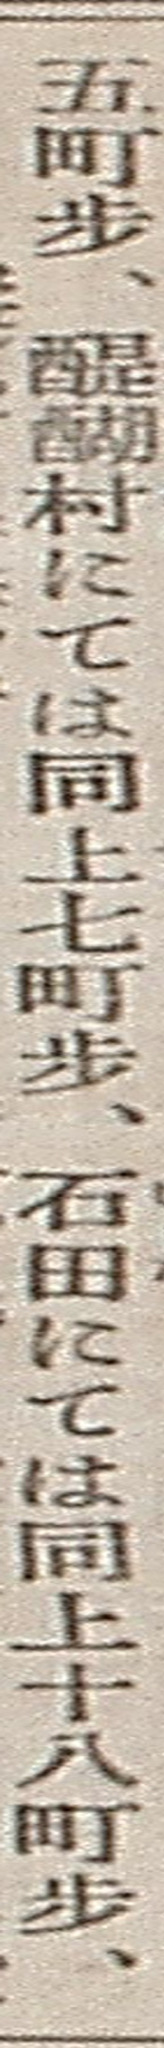五町歩、醍醐村にては同上七町歩、石田にては同上十八町歩、
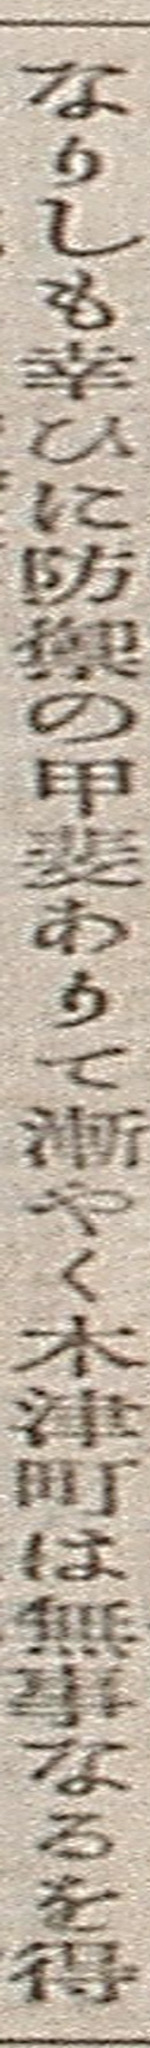なりしも幸ひに防禦の甲斐ありて漸やく木津町は無事なるを得
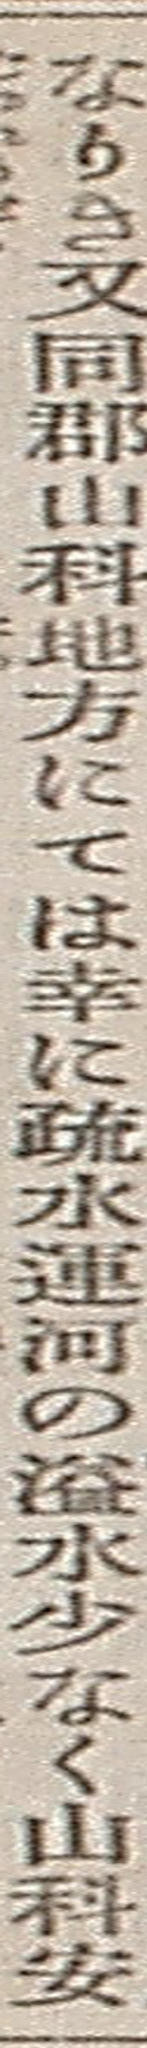なりき又同郡山科地方にては幸に疎水運河の溢水少なく山科安
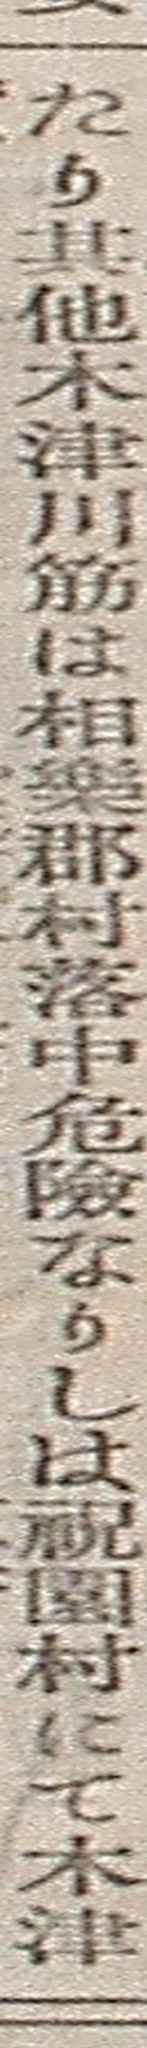たり其他木津川筋は相楽郡村落中危険なりしは祝園村にて木津
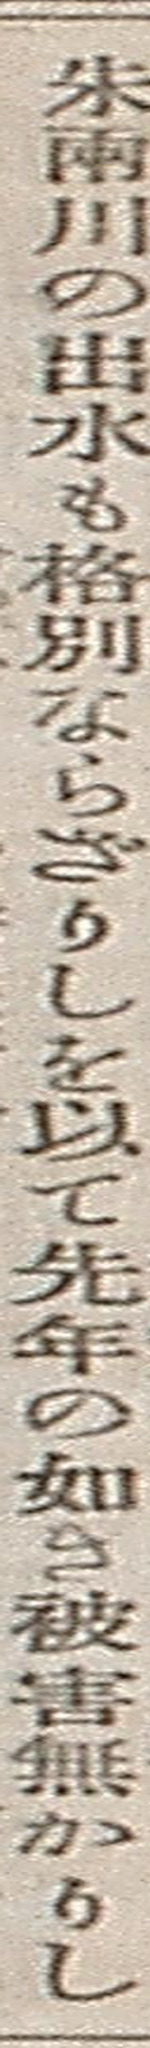朱両川の出水も格別ならざりしをも以て先年の如き被害無かりし
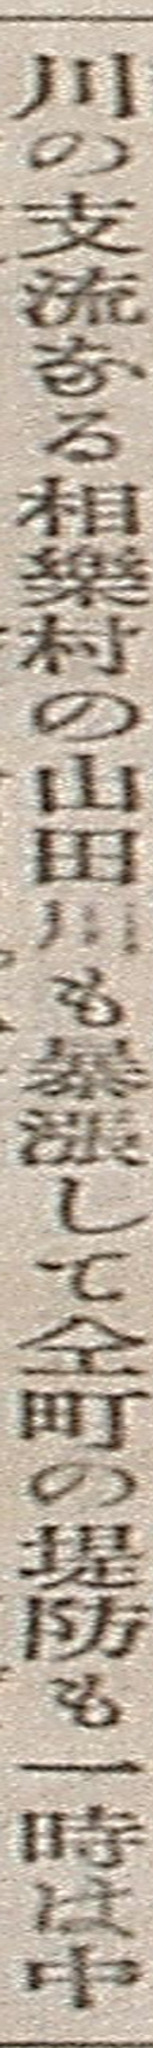川の支流なる相楽村の山田川も暴漲して同町の堤防も一時は中
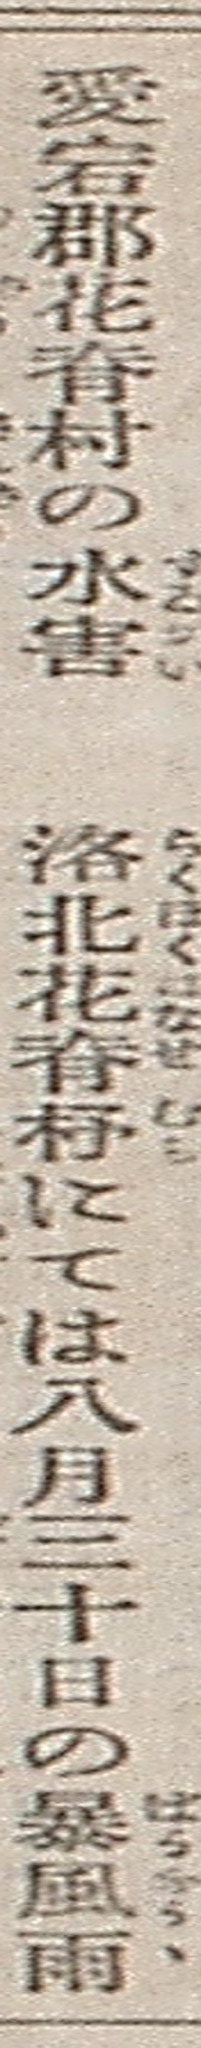愛知郡花脊村の水害洛北花脊杼にては八月三十日の暴風雨
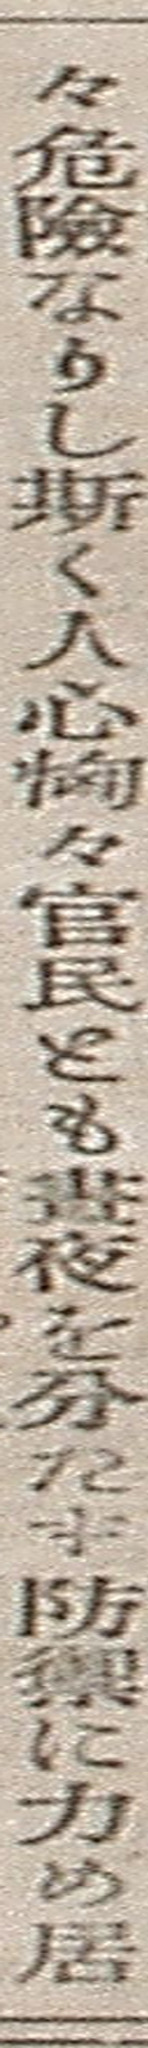々危険なりし斯く人心恟々官民とも晝夜を分たず防禦に力め居
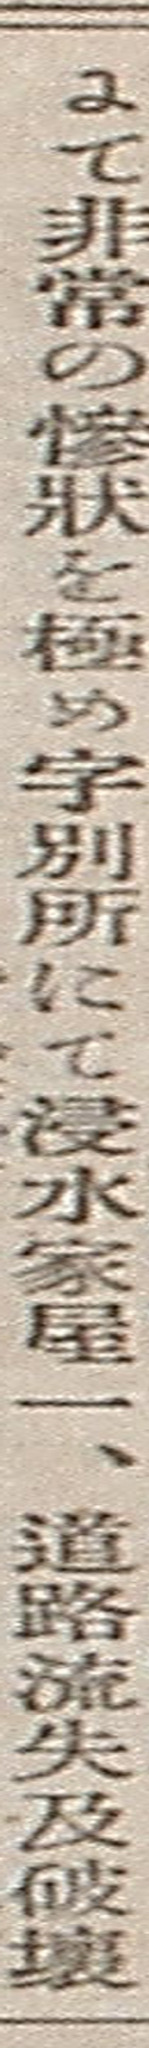にて非常の惨状を極め字別所にて浸水家屋一、道路流失及破壊
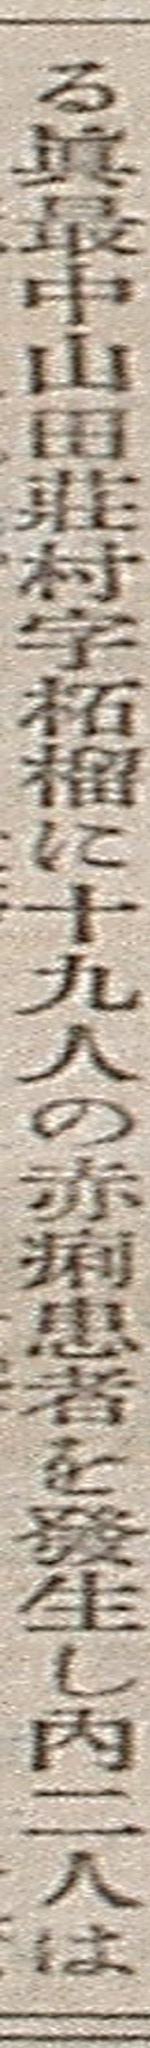る園最中山田荘村字柘榴に十九人の赤痢患者を発生し内二人は
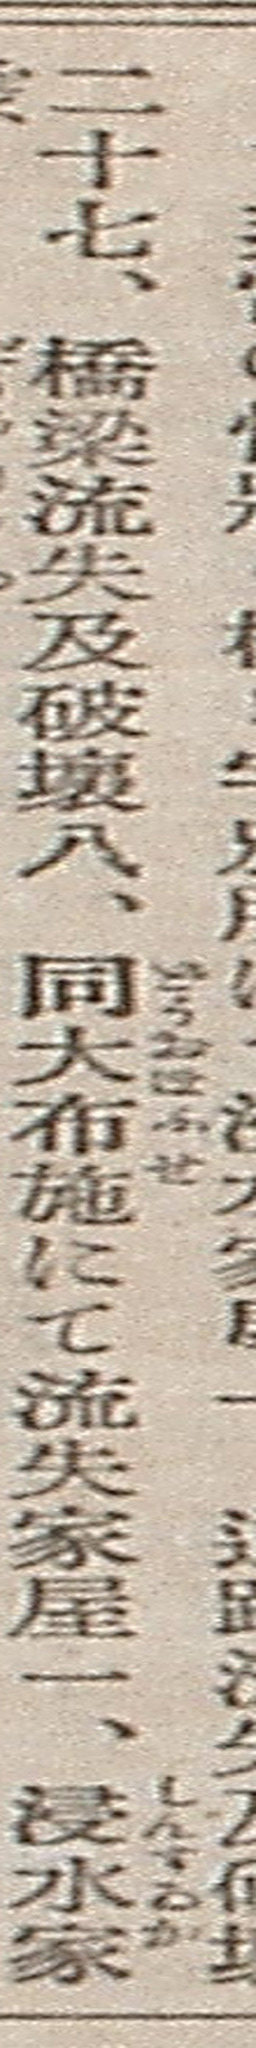二十七、橋梁流失及破壊八、同大布施にて流失家屋一、浸水家
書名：風俗畫報臨時増刊第百二十八號　洪水被害録（下）
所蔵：東京大学地震研究所図書室 Earthquake Research Institute Library, The University of Tokyo, JAPAN
